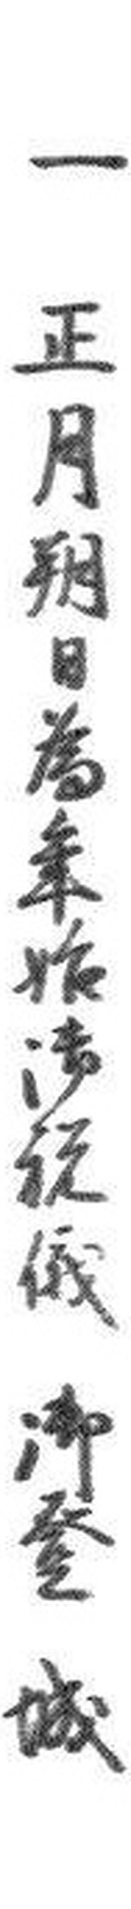一正月朔日為年始御祝儀御登城
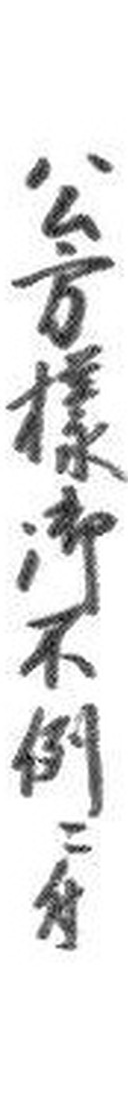公方様御不例ニ付
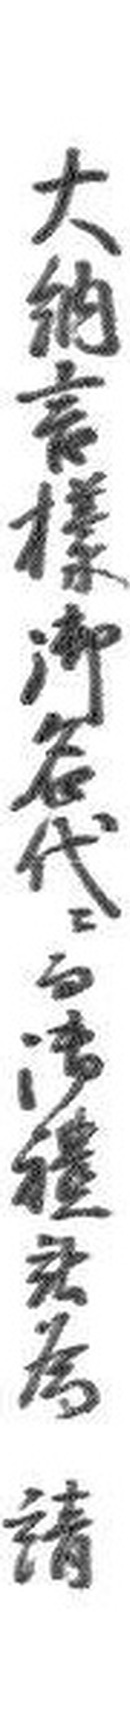大納言様御名代ニ而御礼被為請
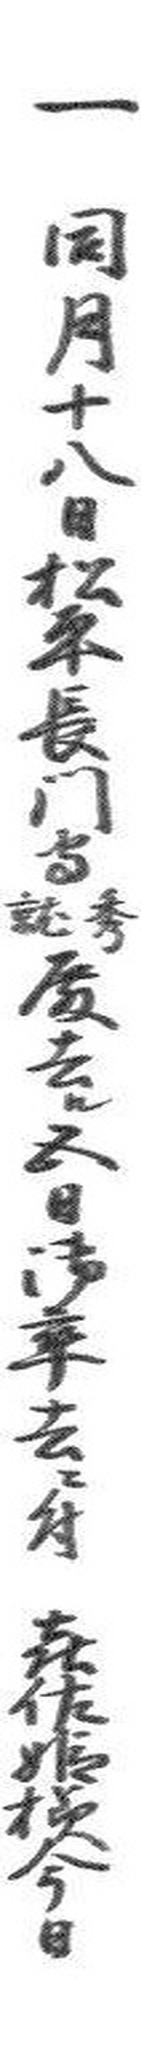一同月十八日松平長門守秀就殿去ル五日御卒去ニ付喜佐姫様今日
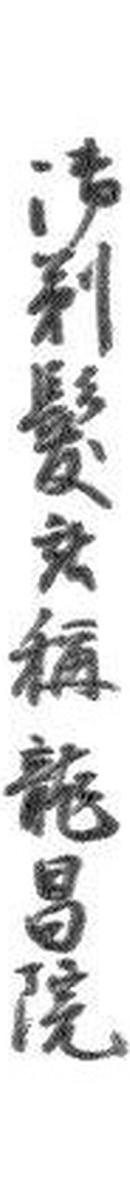御剃髪被称龍昌院

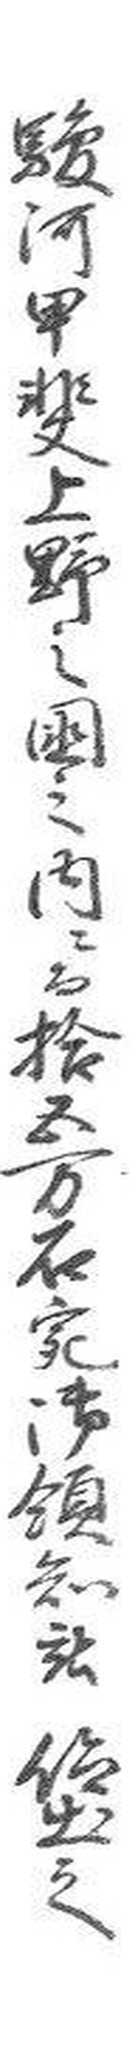駿河甲斐上野之国之内ニ而拾五万石宛御領地被仰出之
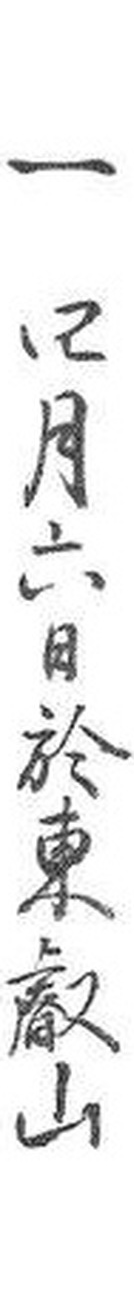一四月六日於東叡山
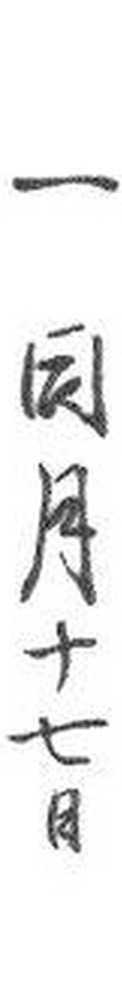一同月廿三日
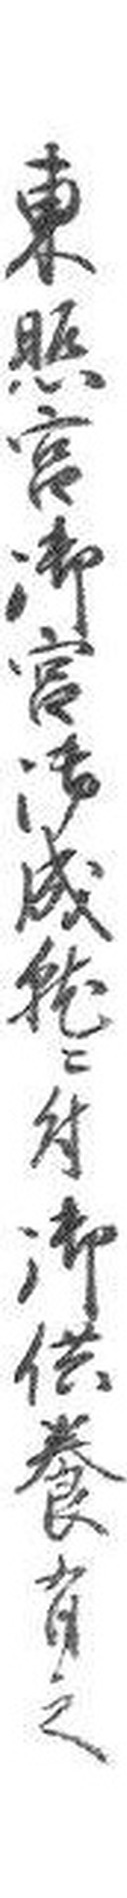一東照宮御宮御成就ニ付御供養有之
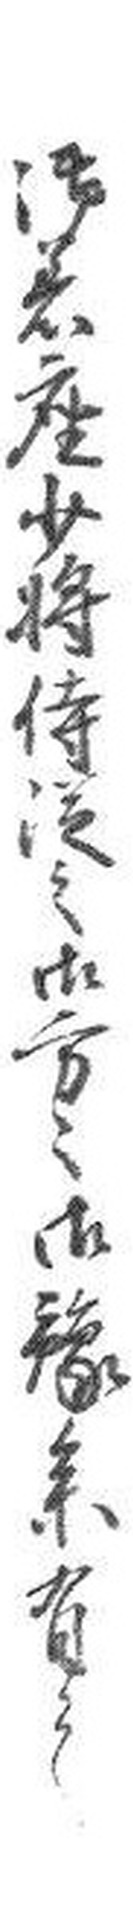御着座少将侍従之御方々御豫参有之
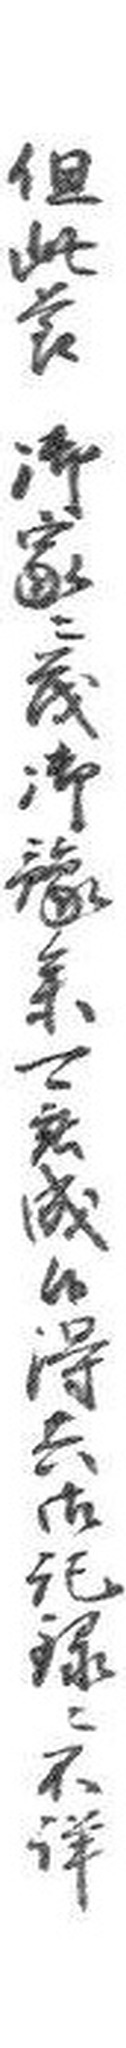但此節御家ニ茂御豫参可被成候得共御記録ニ不詳
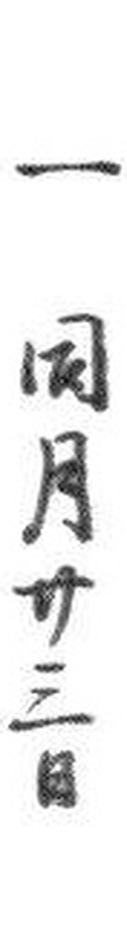一同月廿三日
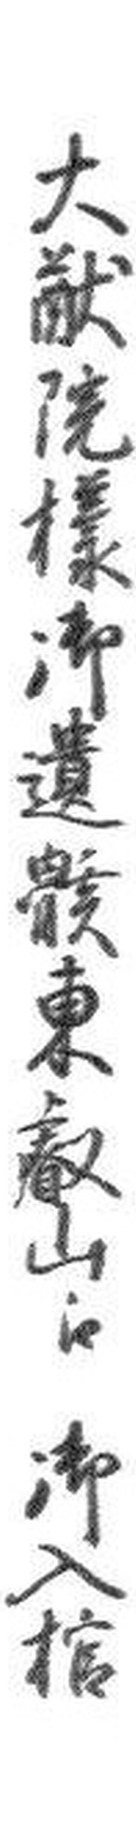大猷院様御遺骸東叡山江御入棺
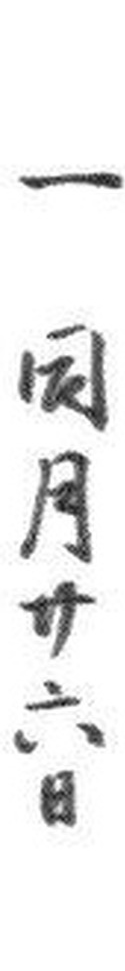一同月廿六日
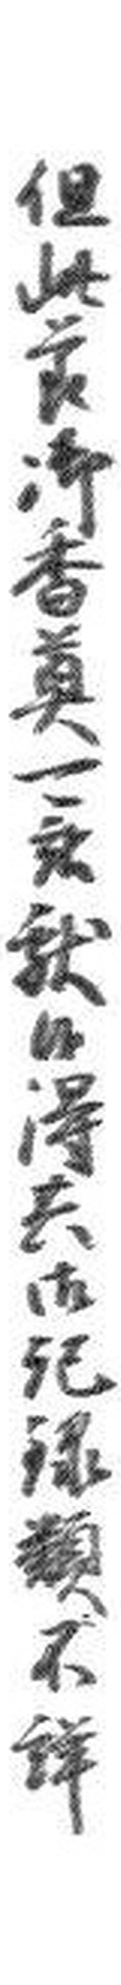但此節御香奠可被献候得共御記録類不詳

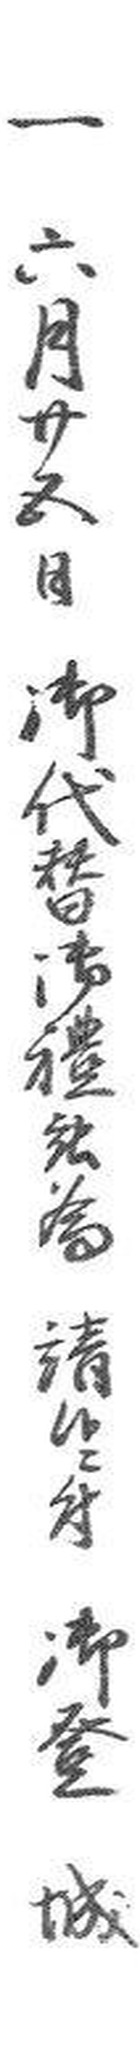一六月廿五日御代替御礼被為請候ニ付御登城
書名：家譜 五 光通公 従寛永十三年到万治二年
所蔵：福井県文書館 Fukui Prefectural Archives
